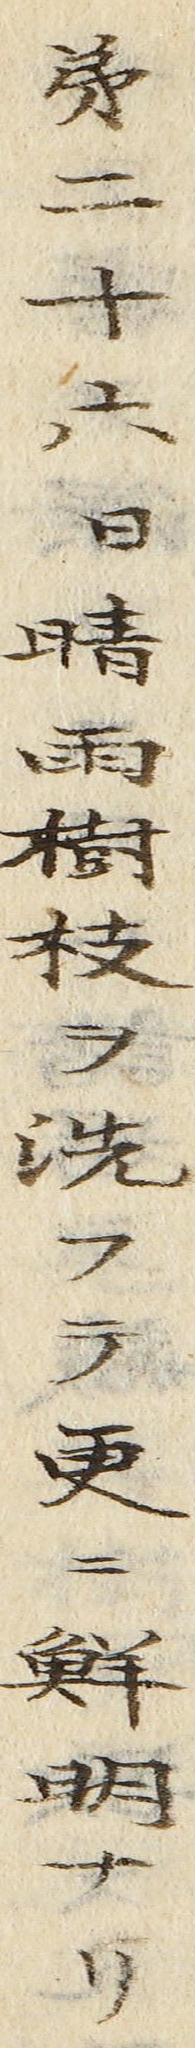第二十六日晴雨樹枝ヲ洗フテ更ニ鮮明ナリ
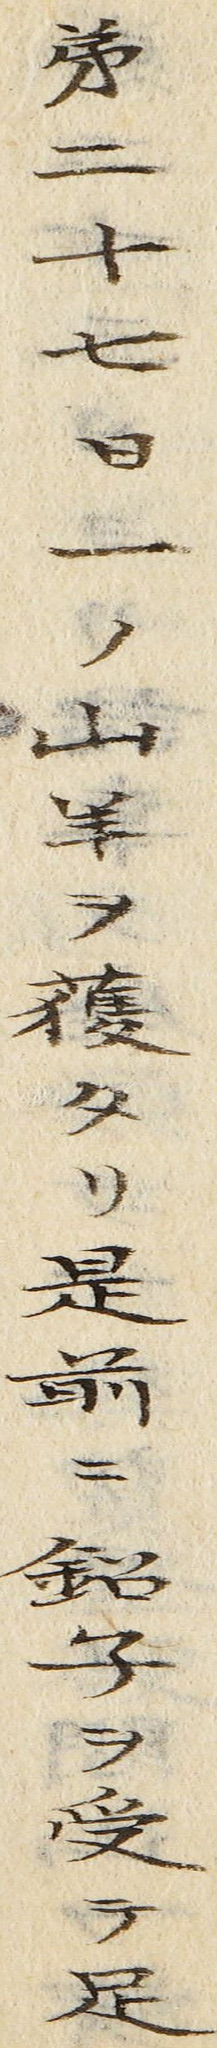第二十七日一ノ山羊ヲ獲タリ是前ニ鉛子ヲ受テ足
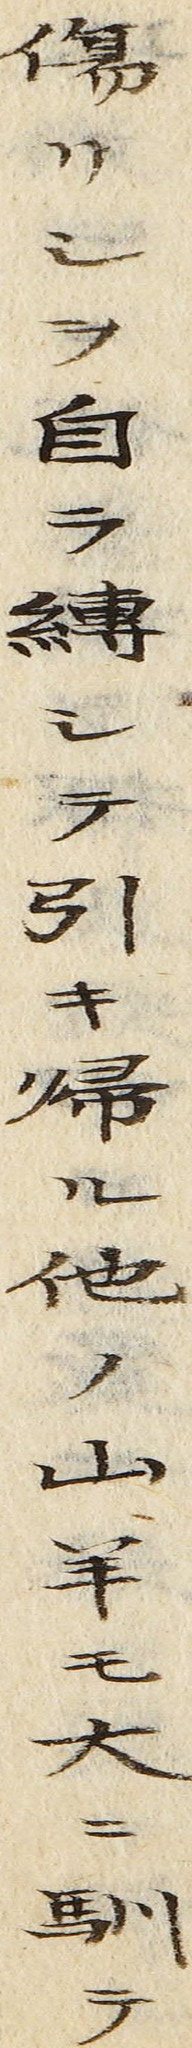傷リシヲ自ラ縛シテ引キ帰ル他ノ山羊モ大ニ馴テ
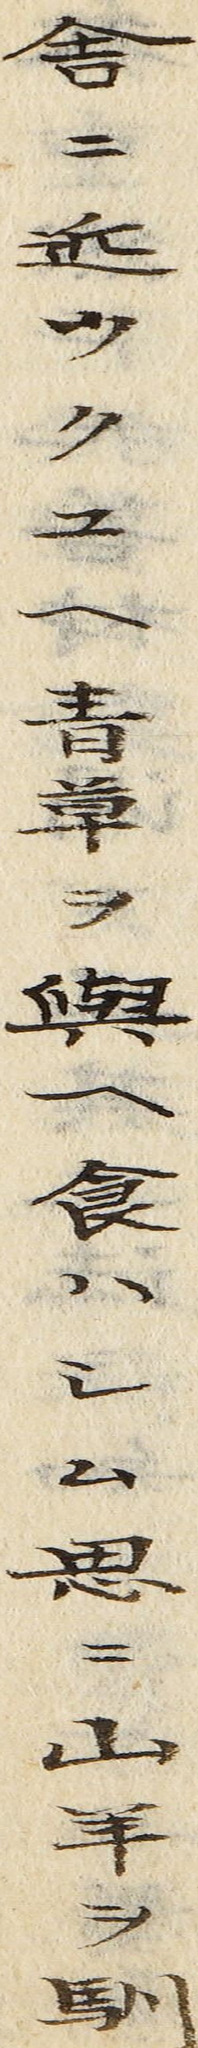舎ニ近ツクユヘ青草ヲ与ヘ食ハシム思ニ山羊ヲ馴
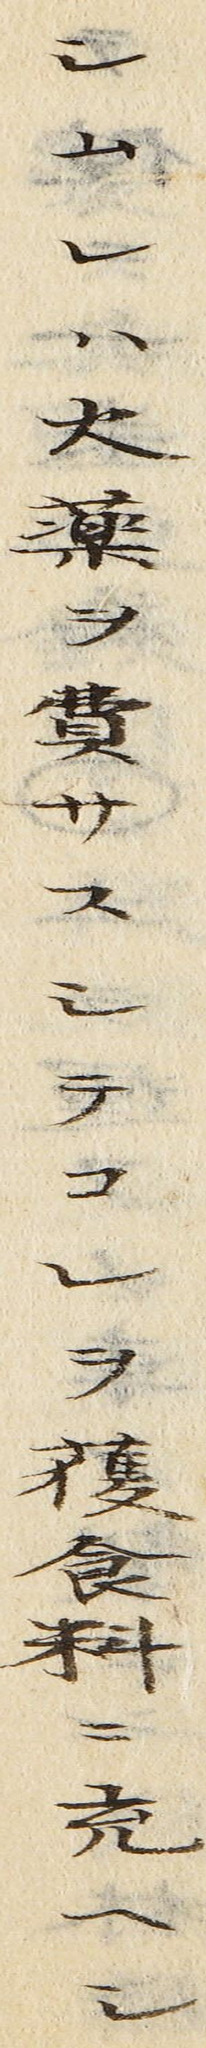シムレハ火薬ヲ費サスシテコレヲ獲食料ニ充ヘシ
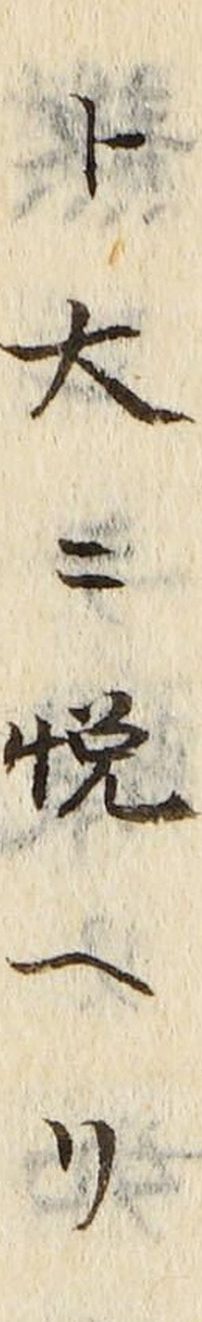ト大ニ悦ヘリ
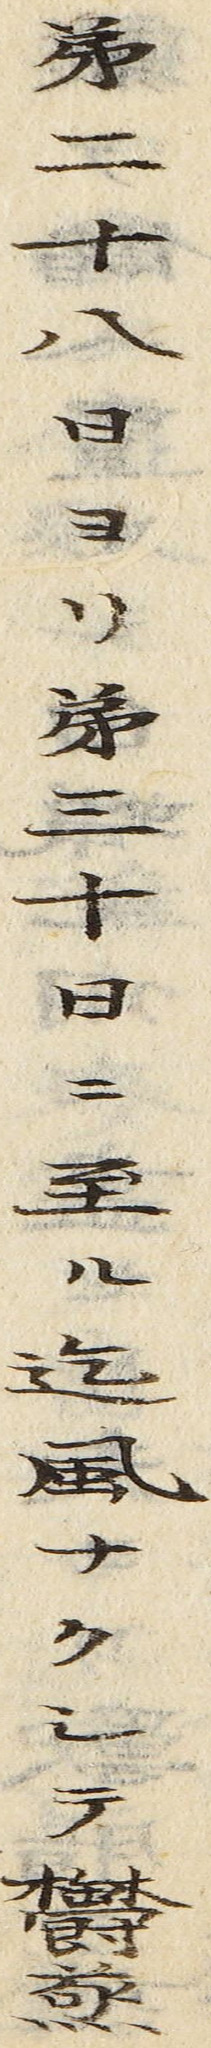第二十八日ヨリ第三十日ニ至ル迄風ナクシテ鬱蒸
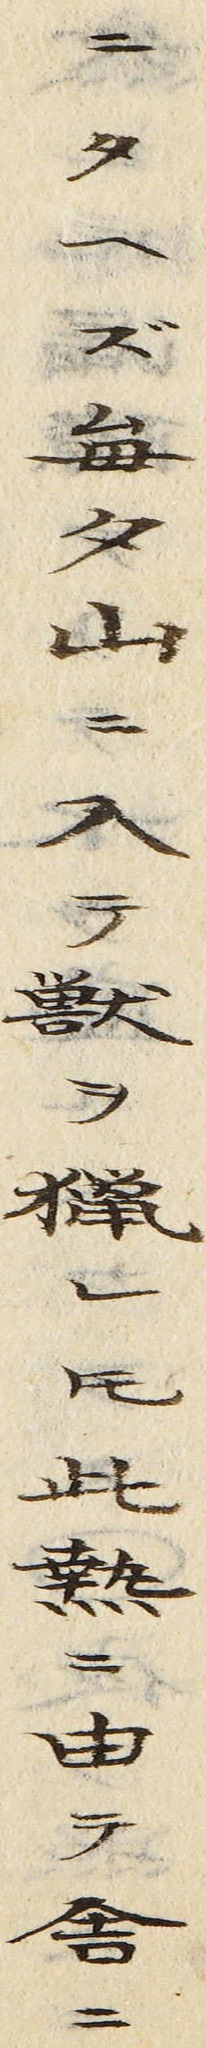ニタヘズ毎夕山ニ入テ獣ヲ猟レトモ此熱ニ由テ舎ニ
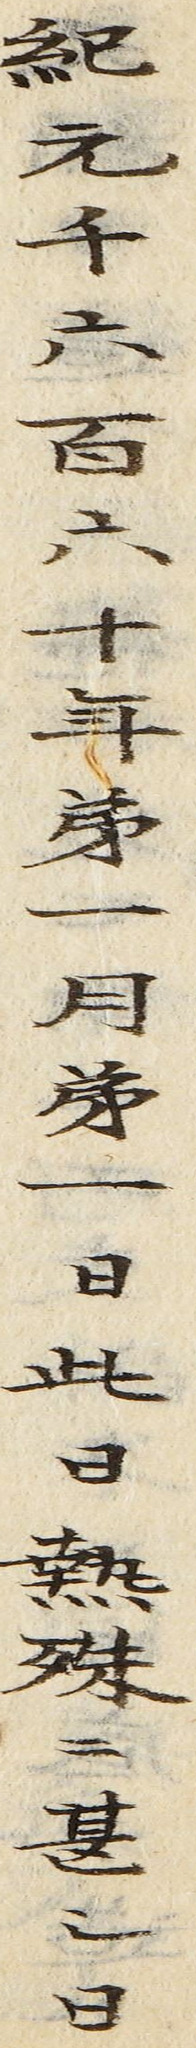紀元千六百六十年第一月第一日此日熱殊ニ甚シ日
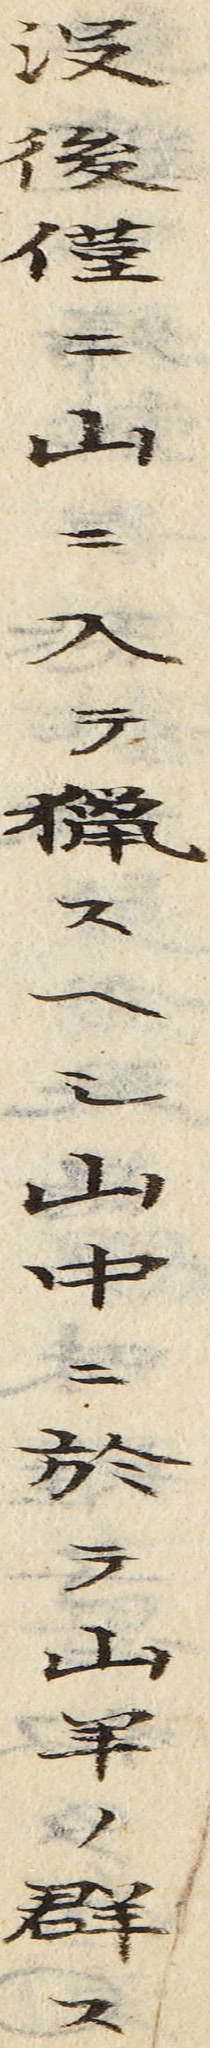没後僅ニ山ニ入テ猟スヘシ山中ニ於テ山羊ノ群ス
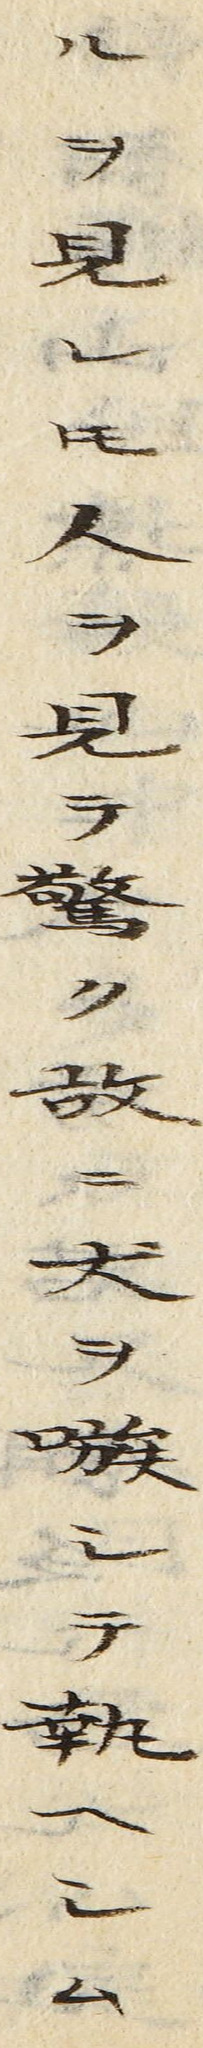ルヲ見レトモ人ヲ見テ驚ク故ニ犬ヲ嗾シテ執ヘシム
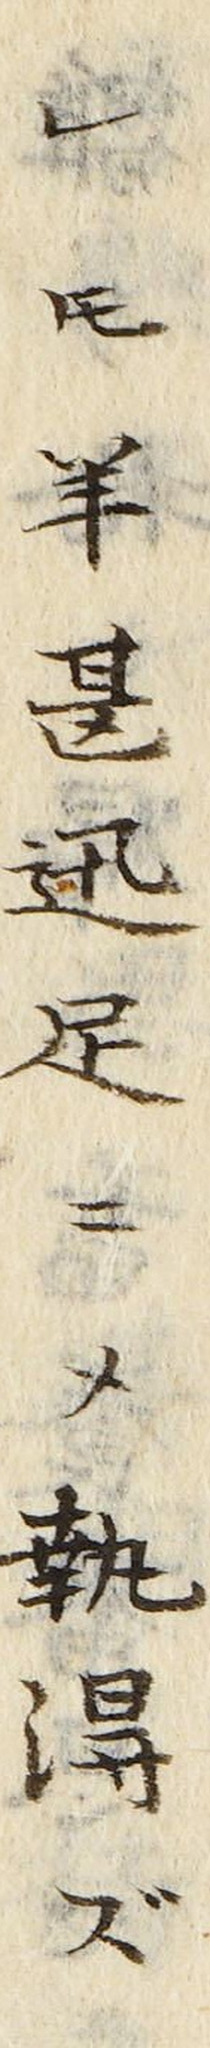レトモ羊甚迅速ニシテ執得ズ
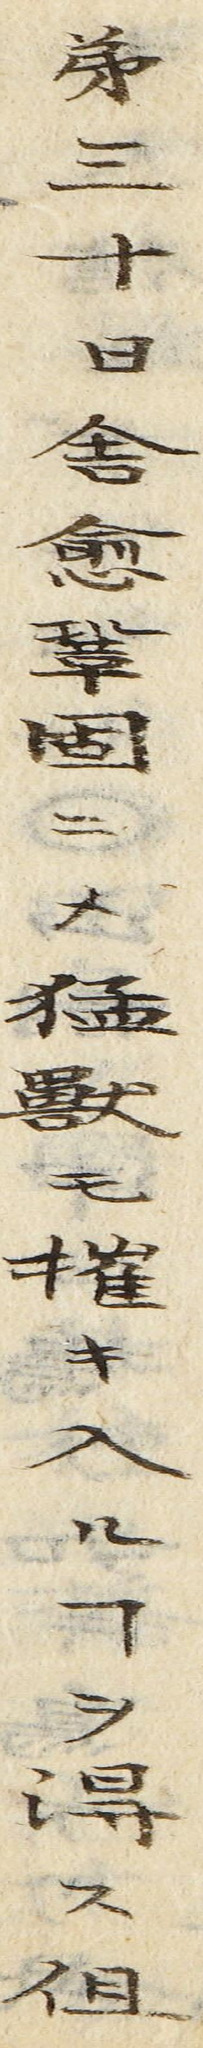第三十日舎愈鞏固ニシテ猛獣モ摧キ入ルコトヲ得ス但
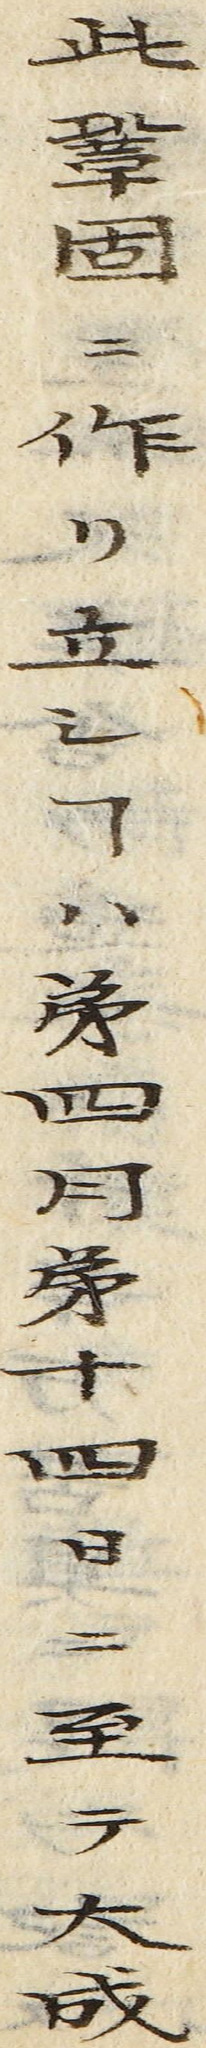此鞏固ニ作リ立シコトハ第四月第十四日ニ至テ大成
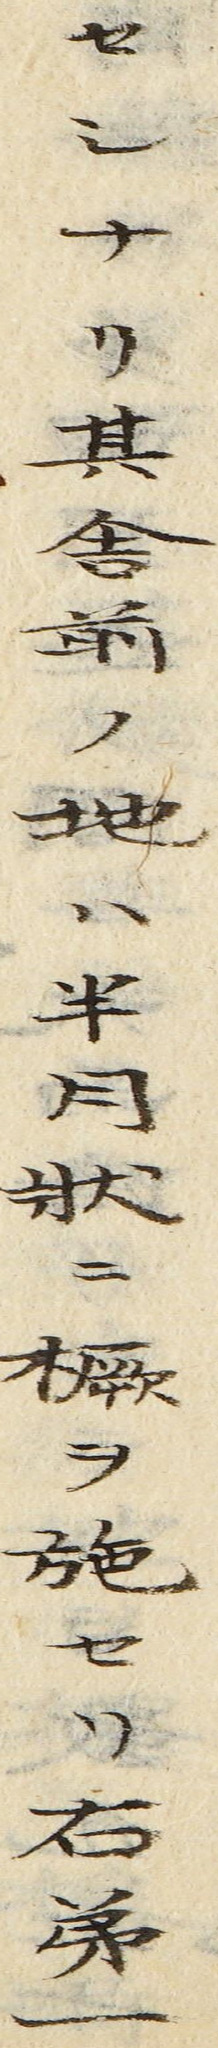セシナリ其舎前ノ地ハ半月状ニ橛ヲ施セリ右第一

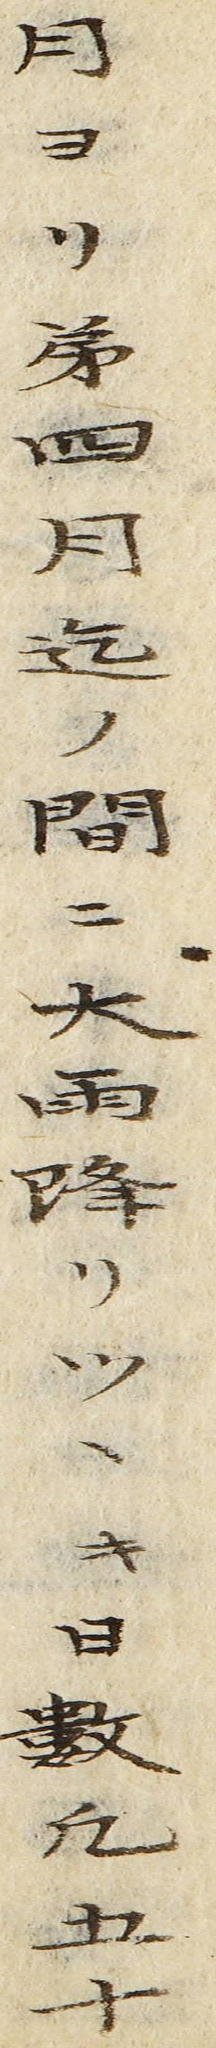月ヨリ第四月迄ノ間ニ大雨降リツヽキ日数凡五十
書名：漂流紀事
